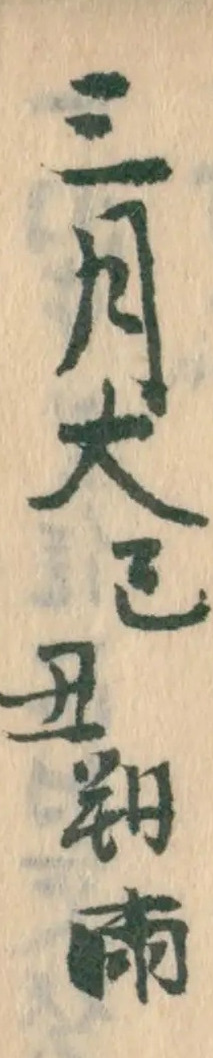三月大己丑朔雨

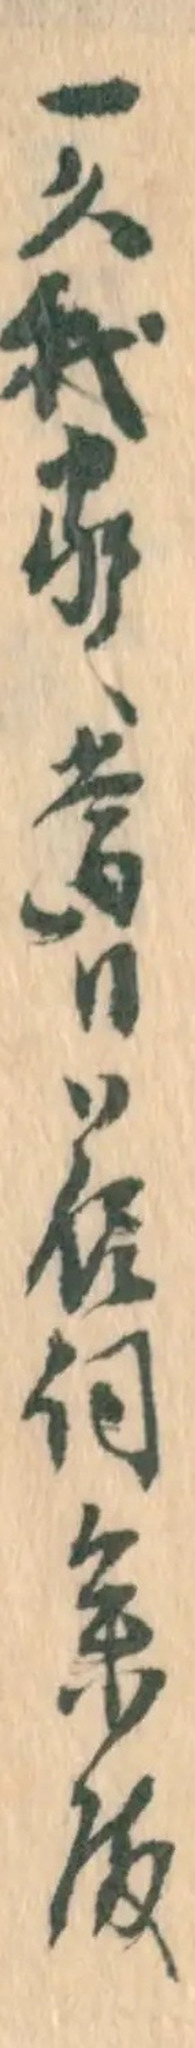一久我家へ当日御祝詞参殿
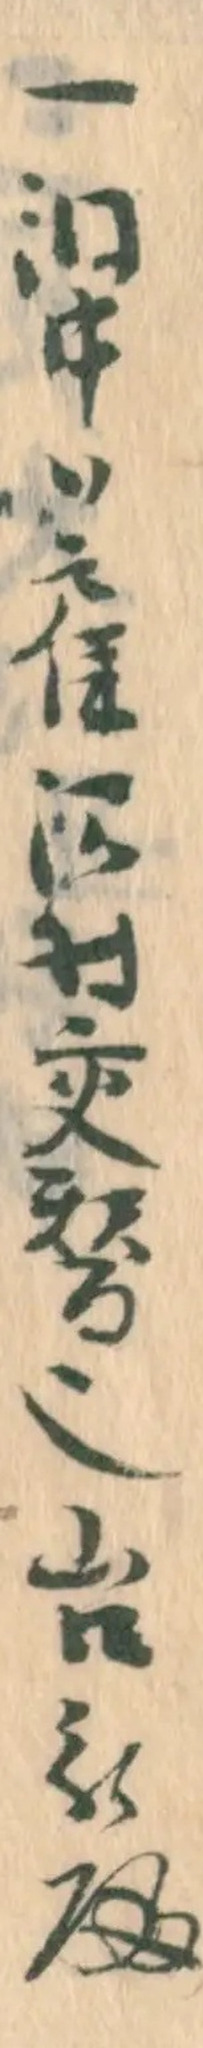一洞中御雇沢村交替也山口被帰
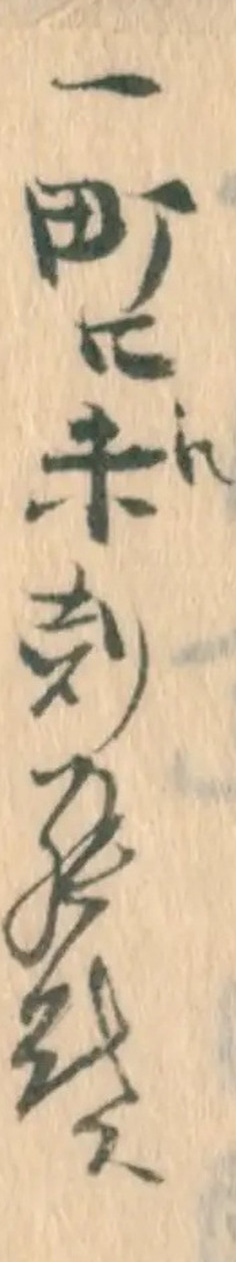一町口え未刻罷越ス
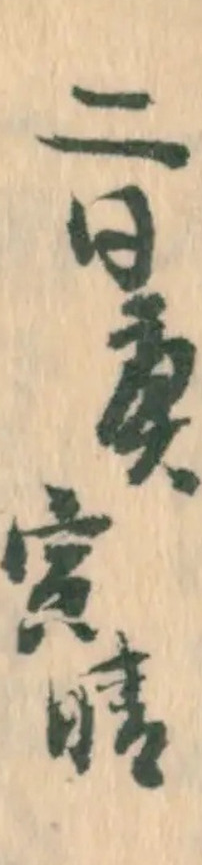二日庚寅晴
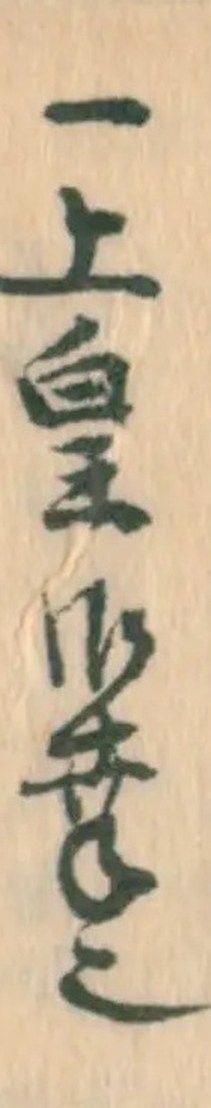一上皇御幸也
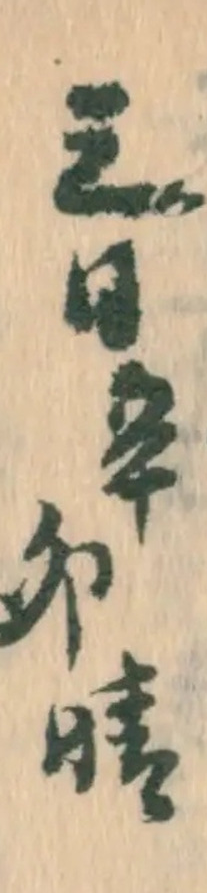三日辛卯晴
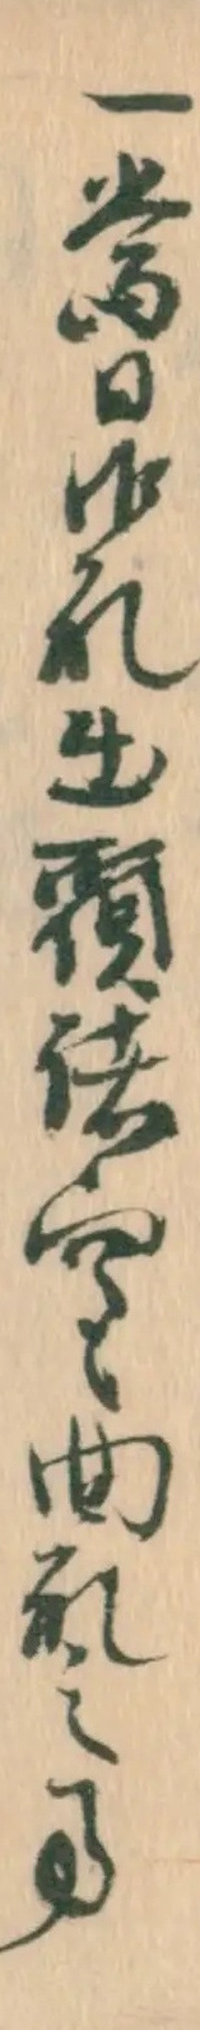一当日御礼出窺諸向へも回礼之事
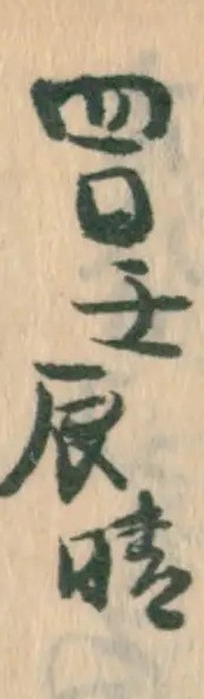四日壬辰晴
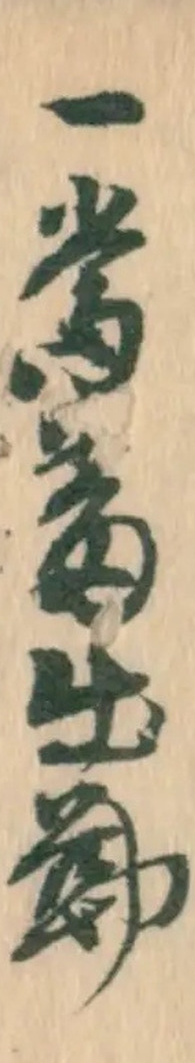一当番出勤
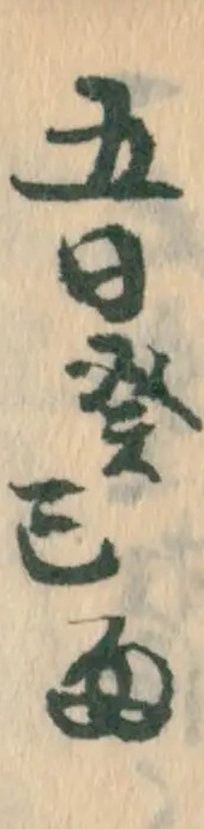五日癸巳雨
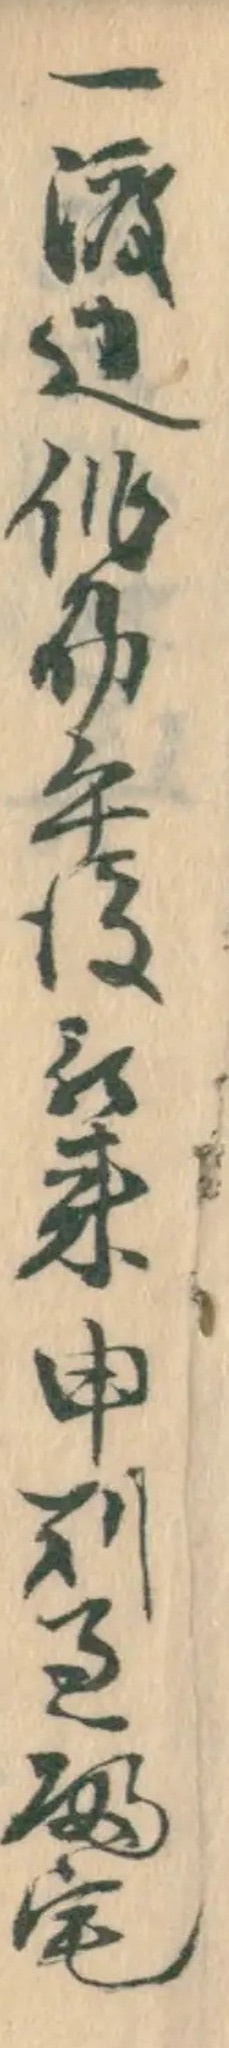一渡辺作州午後被来申刻過帰宅

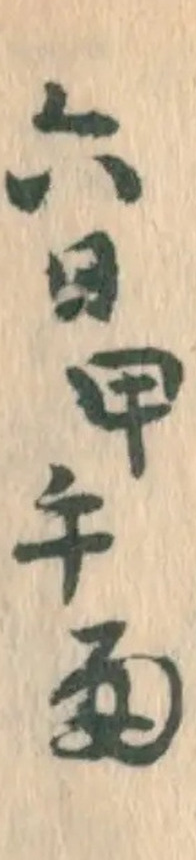六日甲午雨
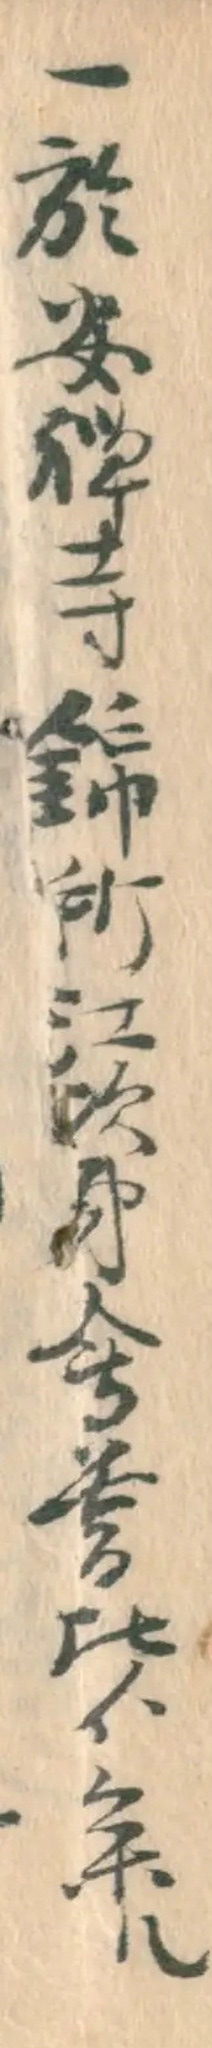一於安禅寺錦所江次第会暮頃ゟ参ル
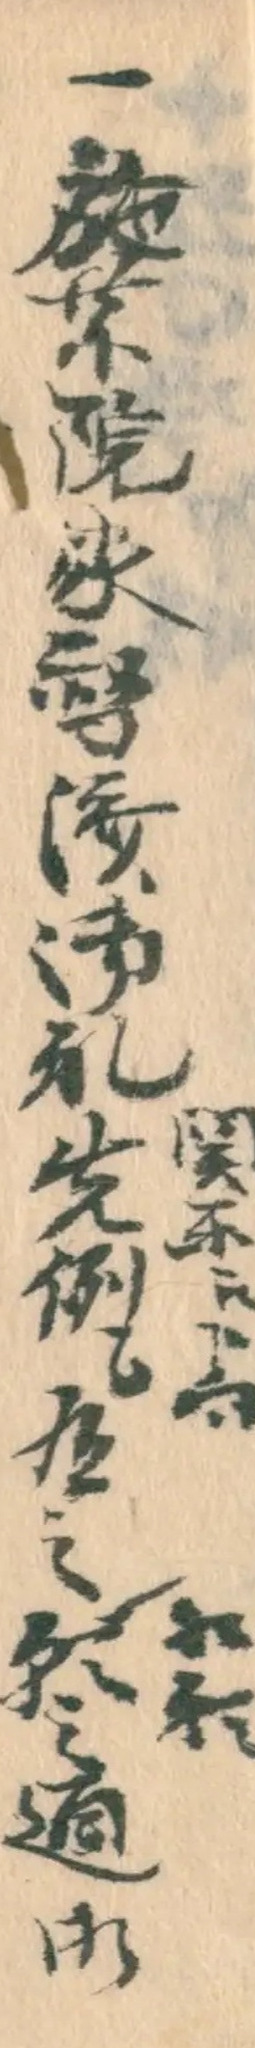一施薬院家督済御礼先例も有之願之通御
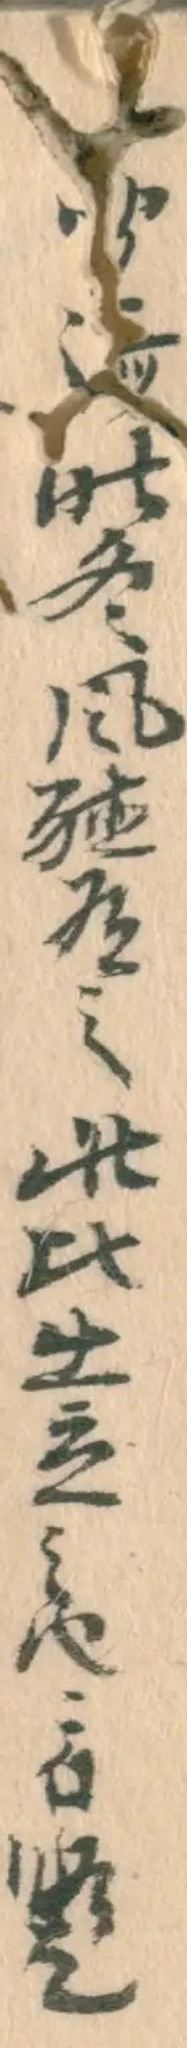聞済昨冬風聴有之此頃出立之由ニ付暇乞
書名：禁裏御所御用日記. [131]
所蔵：国立国会図書館 National Diet Library, JAPAN
